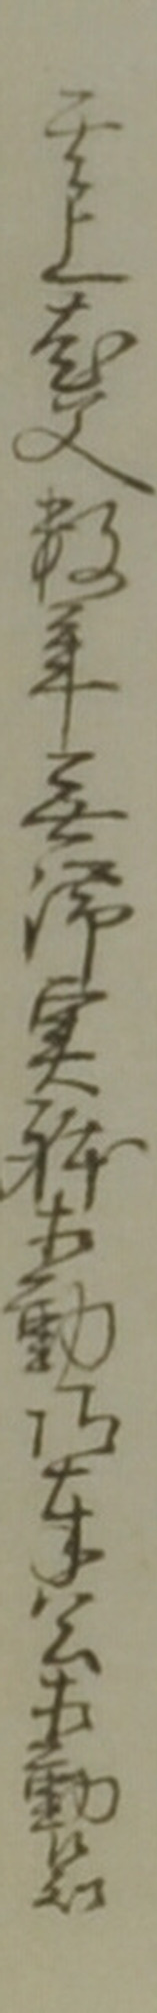其上老父数年無滞実体相勤御奉公相勤候処
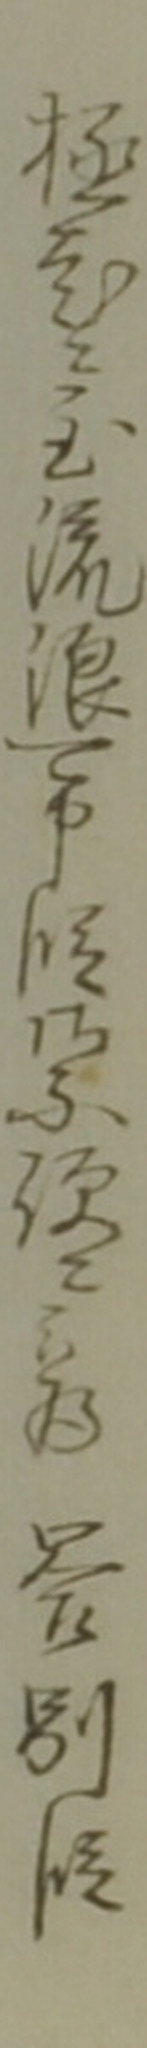極老至流浪可申段御不便被為思召別段
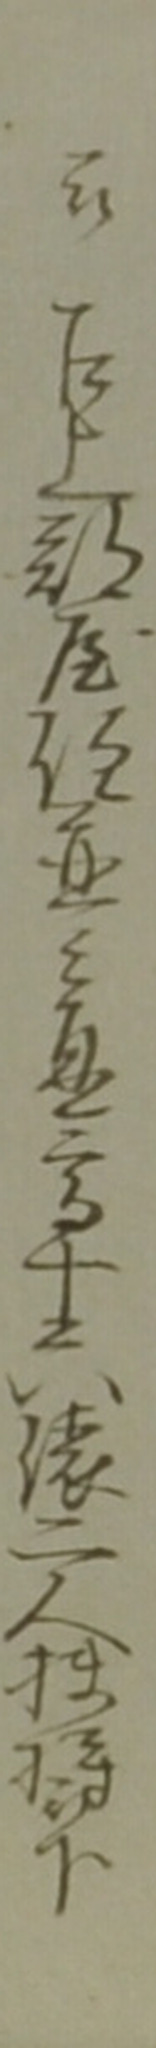被召上部屋住並之通高十六俵二人扶持被下
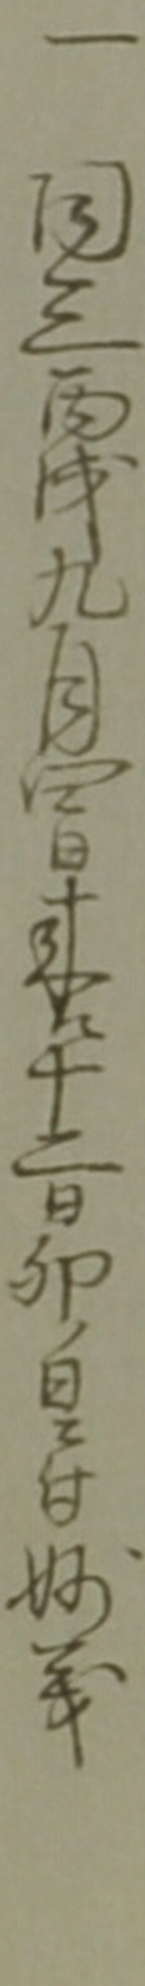一同三丙戌九月四日来十二日卯日妙義
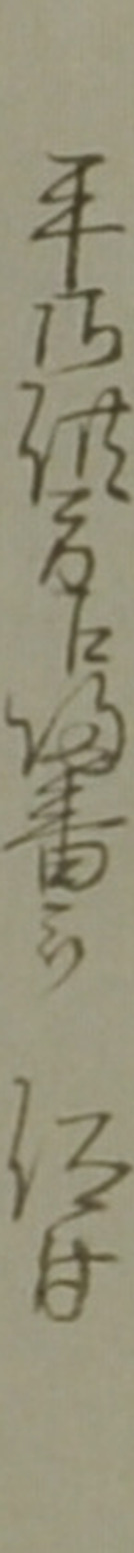平御供方江帰番被仰付
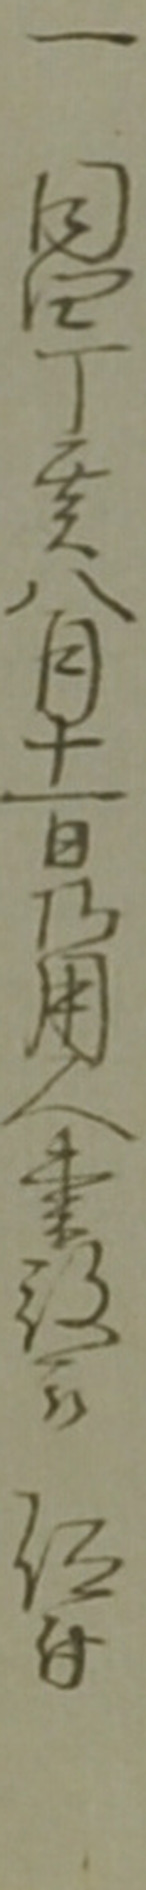一同四丁亥八月十一日御用人書役被仰付
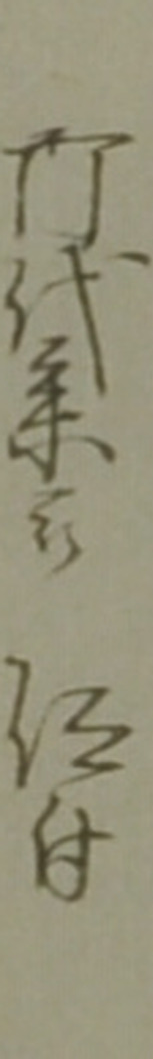御代参被仰付
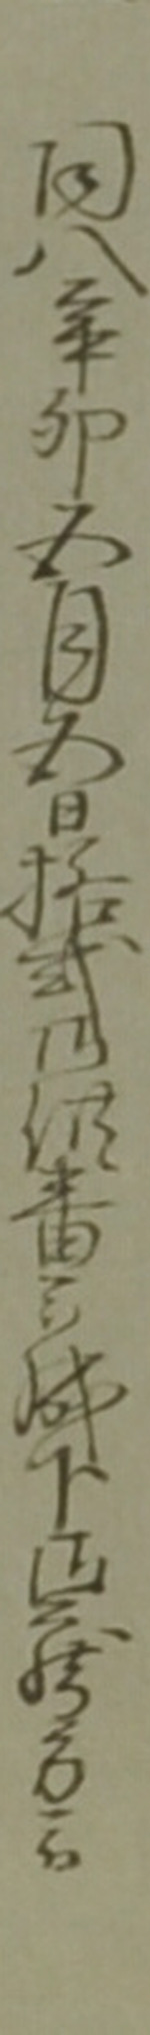一同八辛卯五月五日格式御供番被成下御蔵方被
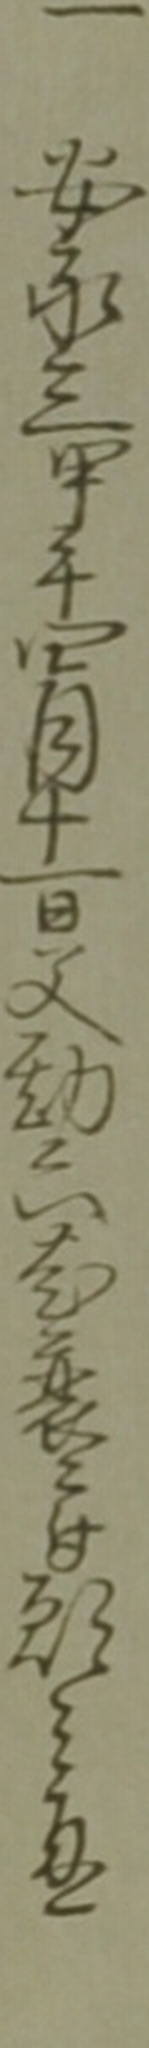一安永三甲午四月十一日父勘六老衰ニ付願之通
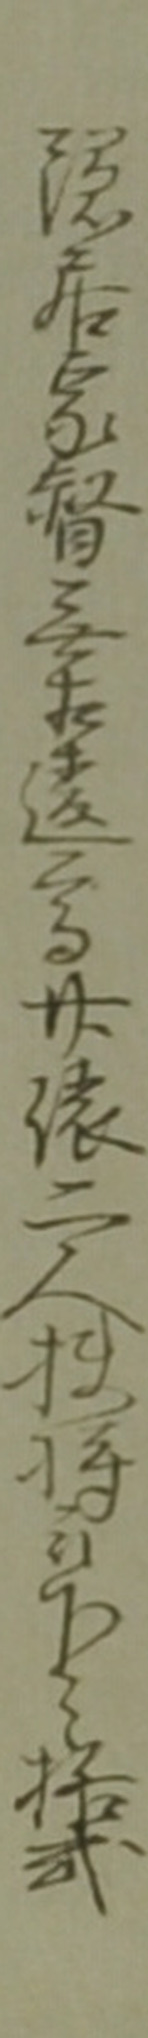隠居家督無相違高廿俵二人扶持被下之格式
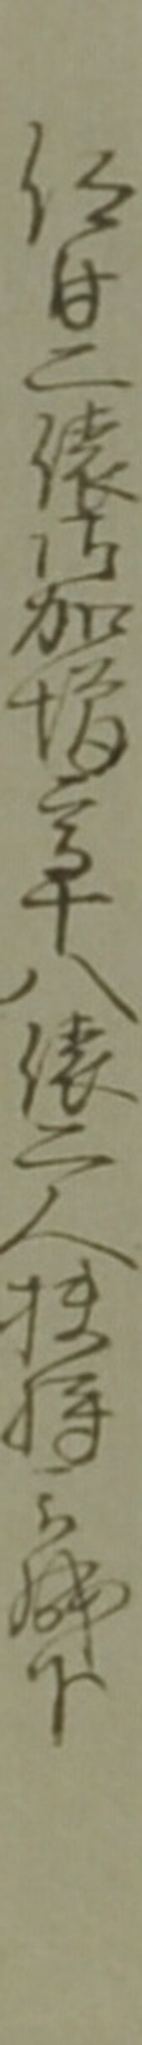仰付二俵御加増高十八俵二人扶持被成下
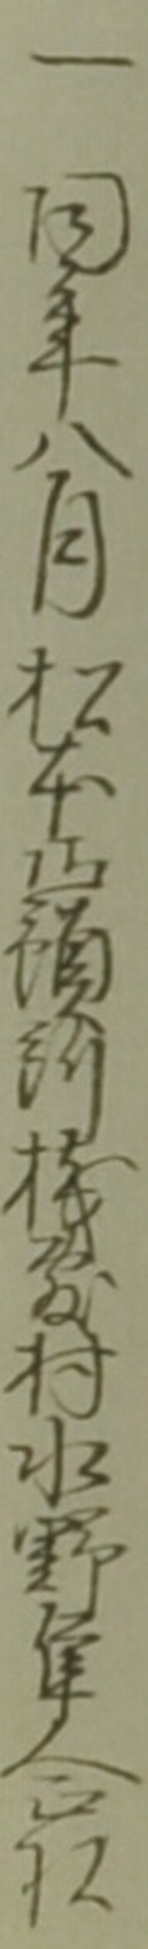一同年八月松本御預所桟敷村水野隼人正様
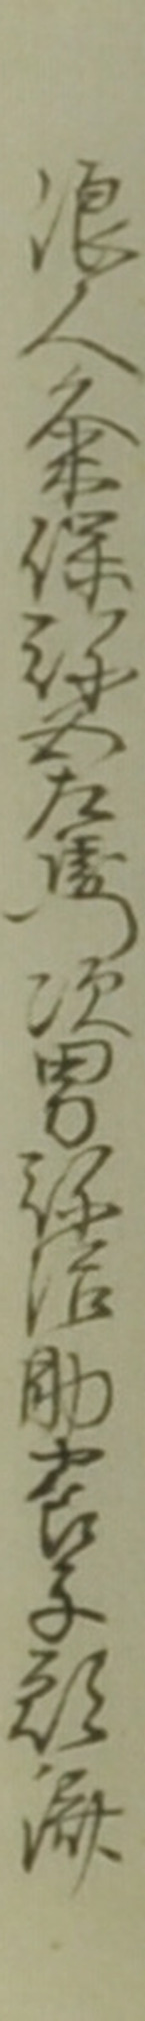浪人粂保弥五左衛門次男祢治助養子願済
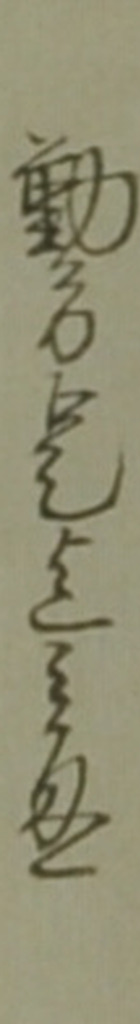勤方是迄之通

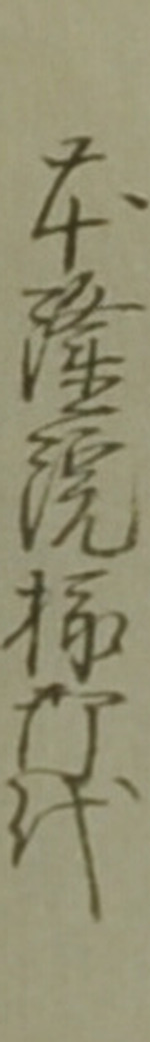本隆院様御代
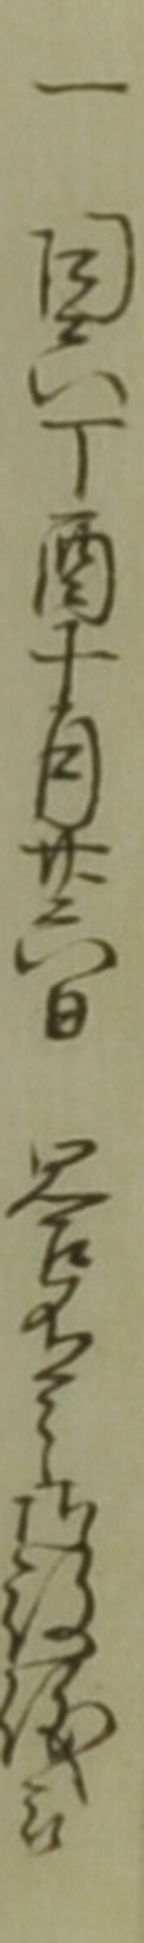一同六丁酉十月廿六日思召有之御役儀被
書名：無足廃家（弐）
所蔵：伊那市立高遠町図書館・合同会社AMANE
